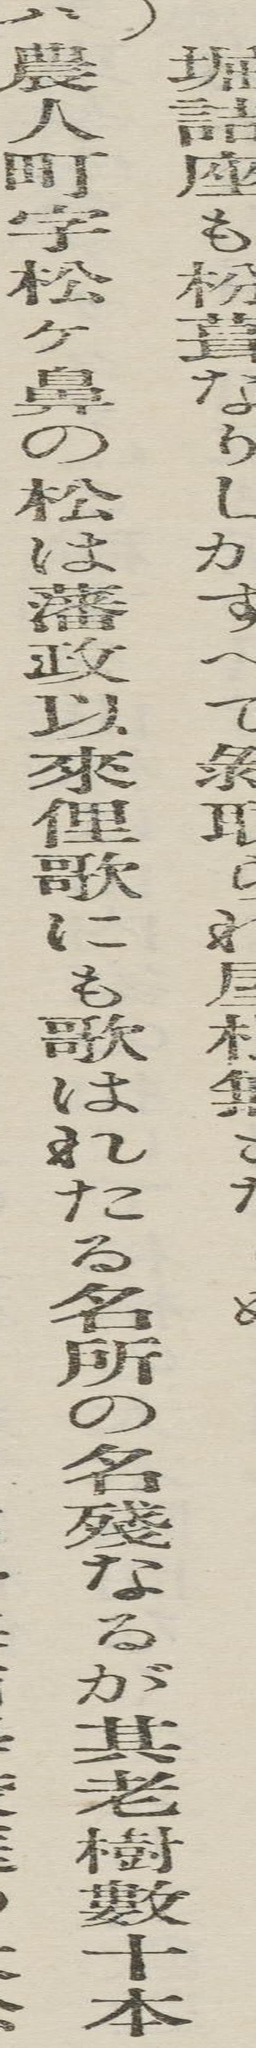農人町字松ケ鼻の松は藩政以来俚歌にも歌はれたる名所の名残なるが其老樹数十本
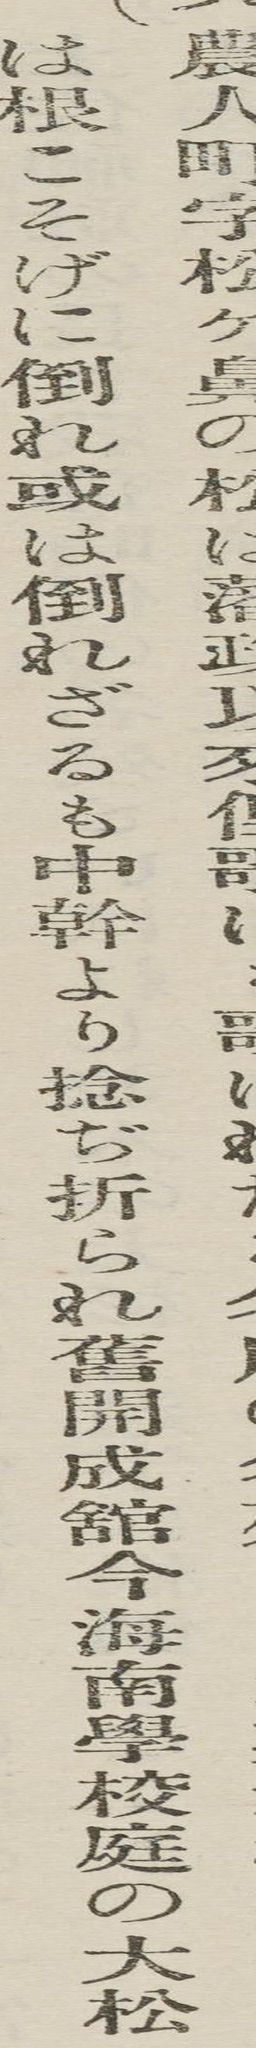は根こそげに倒れ或は倒れざるも中幹より捻ぢ折られ旧開成館今海南学校庭の大松
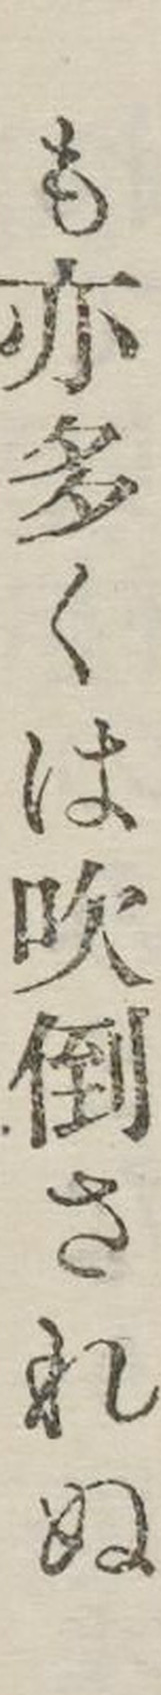も亦多くは吹倒されぬ
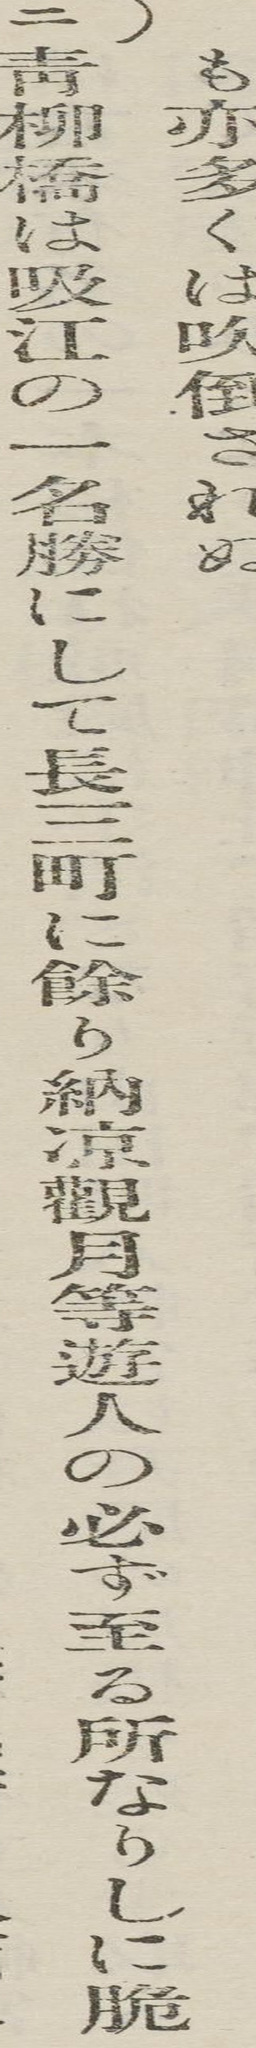青柳橋は吸江の一名勝にして長三町に余り納涼観月等遊人の必ず至る所なりしに脆
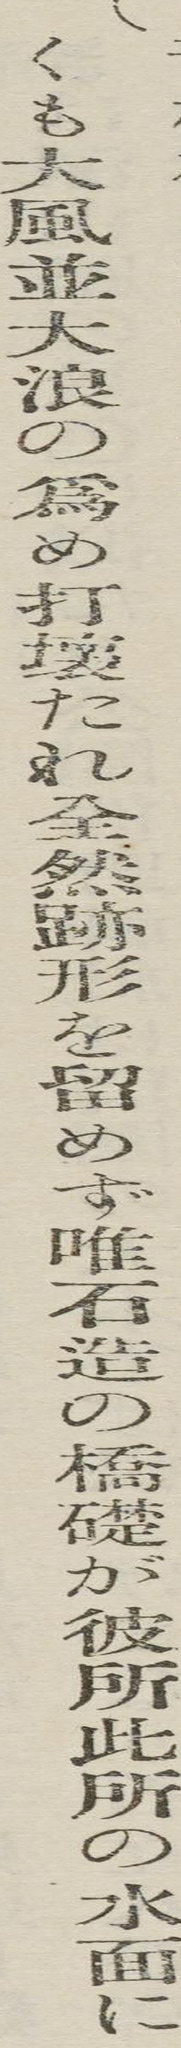くも大風並大浪の為め打壊たれ全然跡形を留めず唯石造の橋礎が彼所此所の水面に
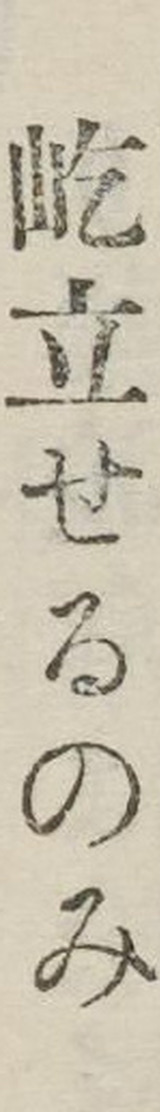屹立せるのみ
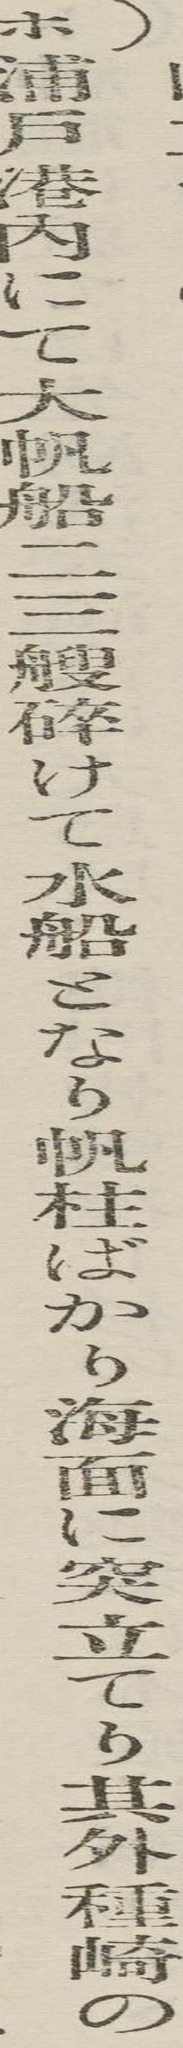浦戸湾内にて大帆船二三艘砕けて水船となり帆柱ばかり海面に突立てり其外種崎の
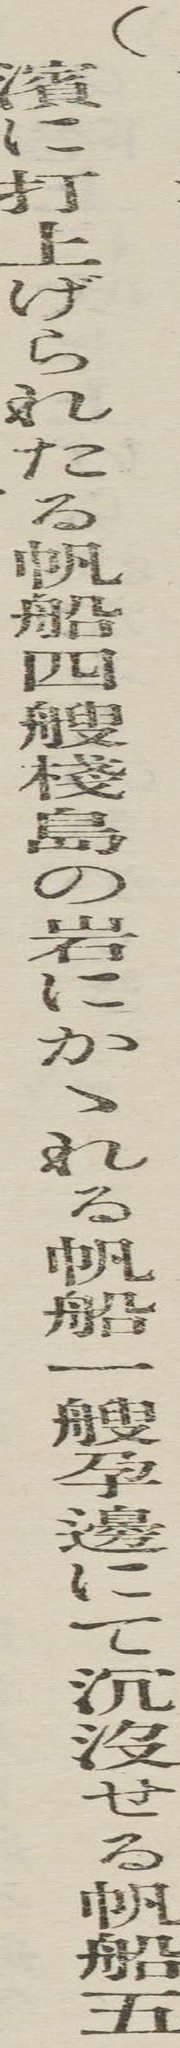浜に打上げられたる帆船四艘桟島の岩にかゝれる帆船一艘孕辺にて沉没せる帆船五
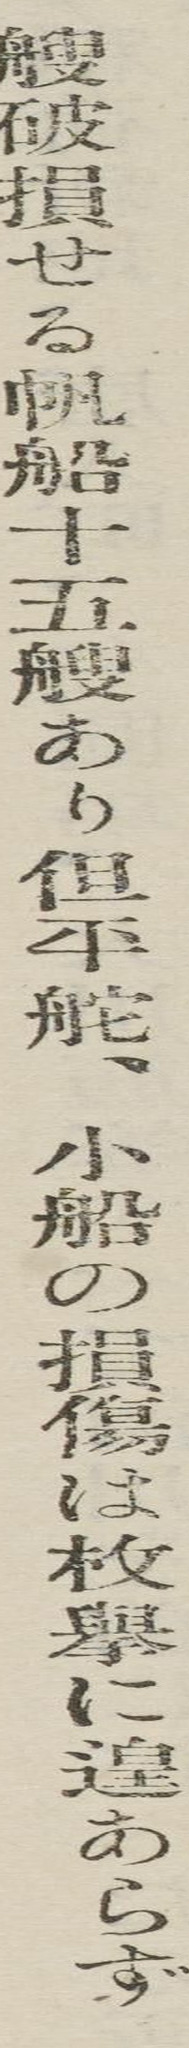艘破損せる帆船十五艘あり但平舵、小船の損傷は枚挙に遑あらず

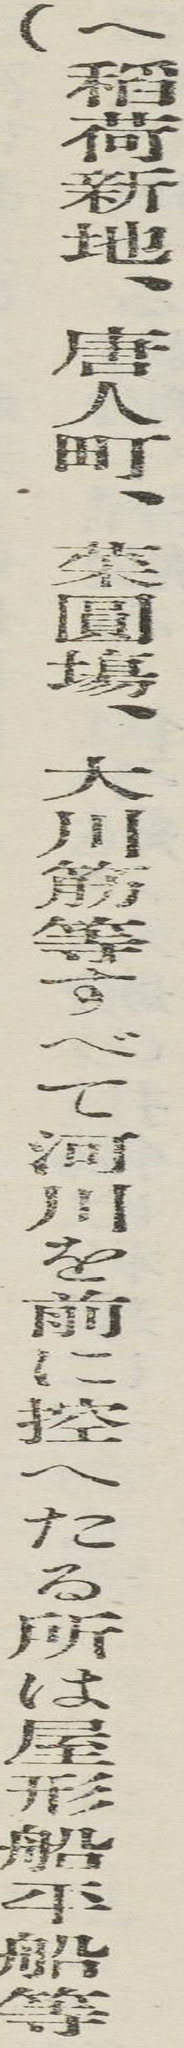稲荷新地、唐人町、菜圓場、大川筋等すべて河川を前に控へたる所は屋形船平船等
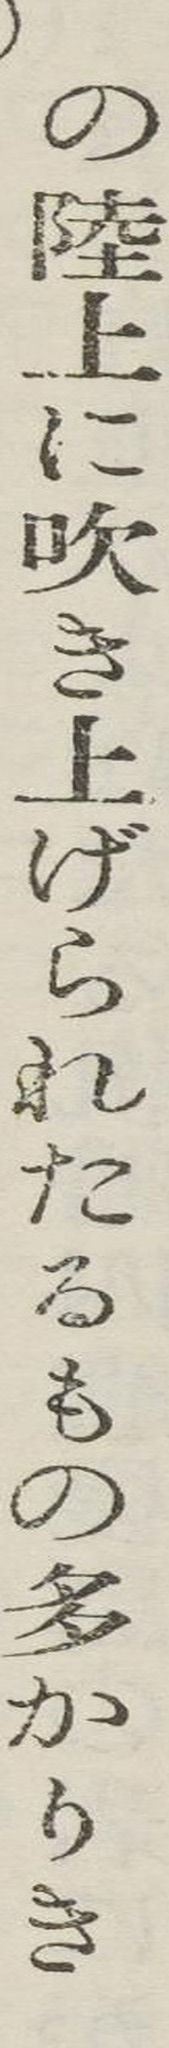の陸上に吹き上げられたるもの多かりき
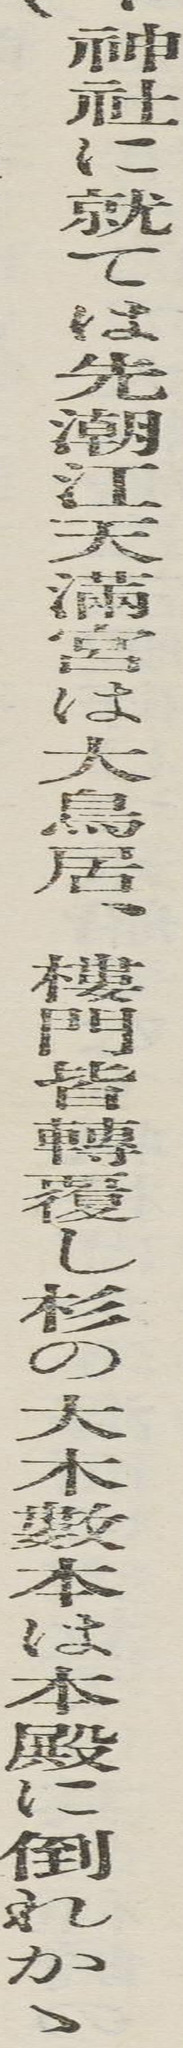神社に就ては先潮江天満宮は大鳥居、楼門皆転覆し杉の大木数本は本殿に倒れかゝ
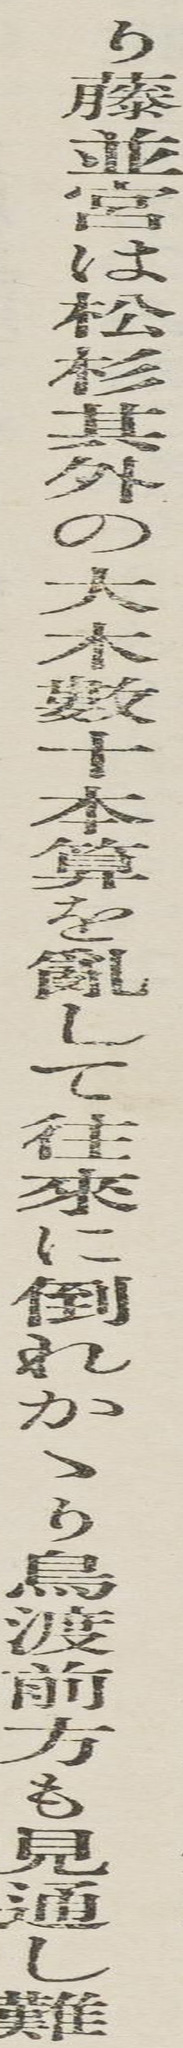り藤並宮は松杉其外の大木数十本算を乱して往来に倒れかゝり鳥渡前方も見通し難
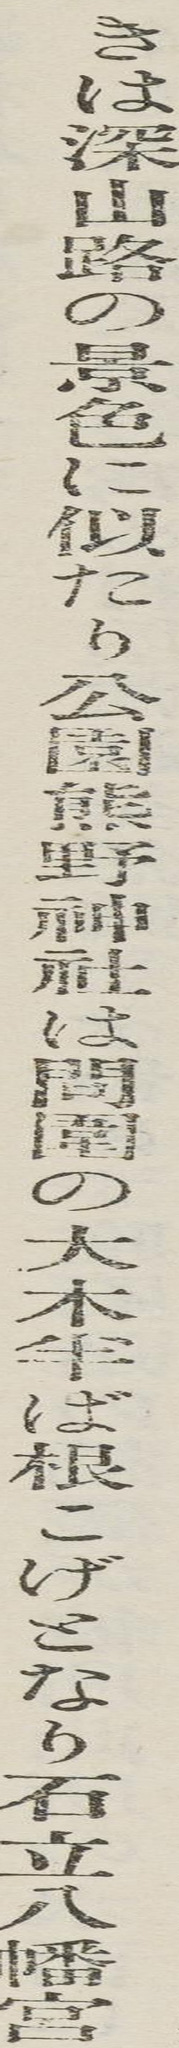きは深山路の景色に似たり公園熊野神社は問囲の大木半ば根こげとなり石立八幡宮
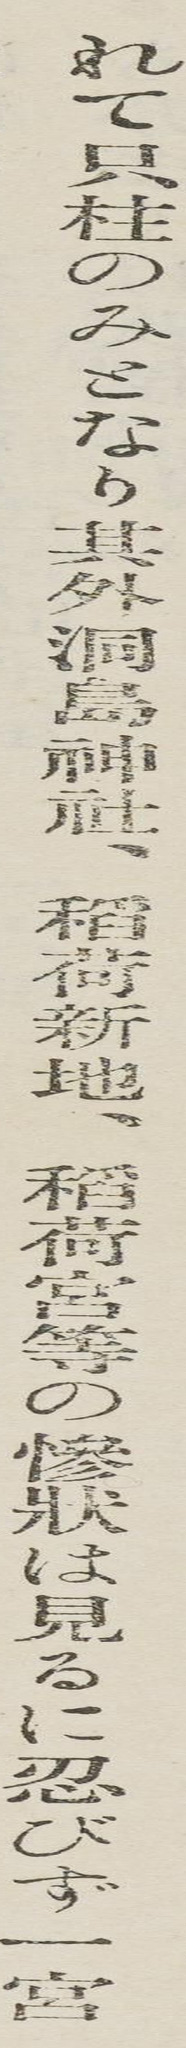れて只柱のみとなり其外洞島神社、稲荷新地、稲荷宮等の惨状は見るに忍びず一宮
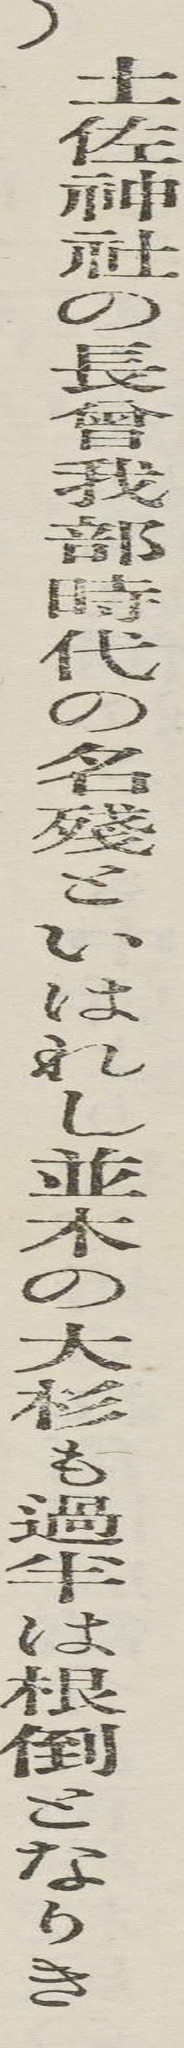土佐神社の長曽我部時代の名残といはれし並木の大杉も過半は根倒となりき
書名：土佐古今ノ地震
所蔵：東京大学地震研究所図書室 Earthquake Research Institute Library, The University of Tokyo, JAPAN
